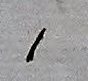1
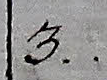3.
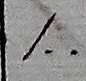1.
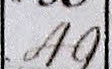49
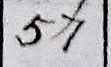57
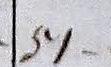51
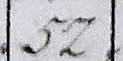52
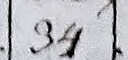34
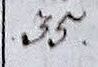35
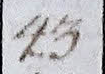43
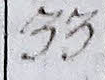33
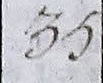35
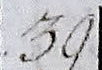39
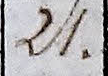21
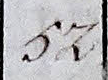52
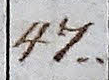47
